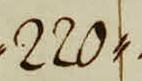220
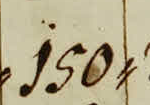150
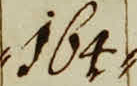164
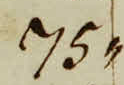75
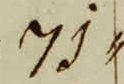71
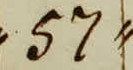57
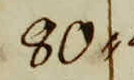80
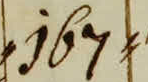167
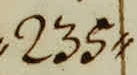235
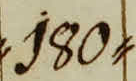180
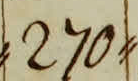270
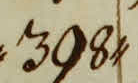398
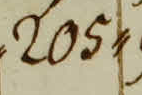205
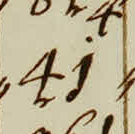41
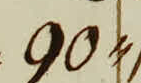90
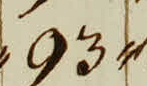93
